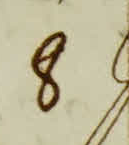8
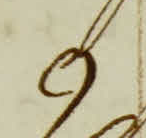9
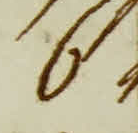6
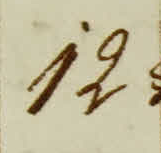12
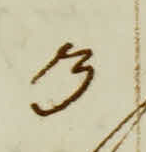3
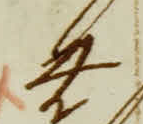4
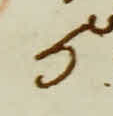5
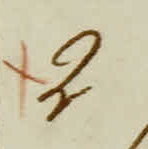2
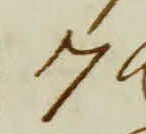7
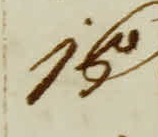15
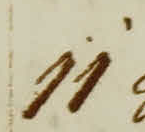11
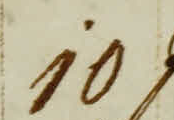10
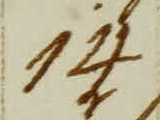14
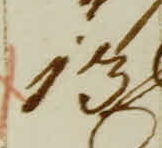13
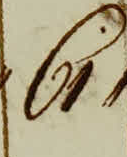61
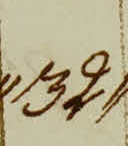32
